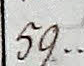59
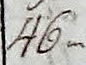46
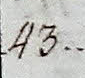43
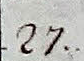27
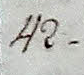42
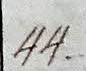44
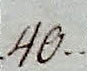40
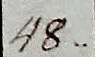48
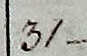31
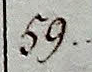59
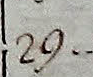29
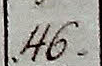46
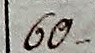60
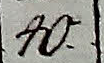40.
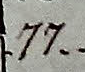77
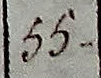55
